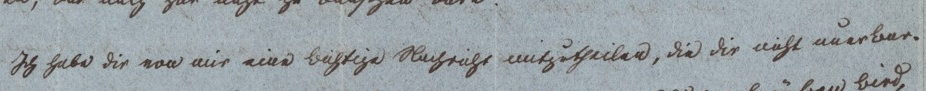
Ich habe Dir von mir eine wichtige Nachricht mitzutheilen, die Dir nicht unerwar-
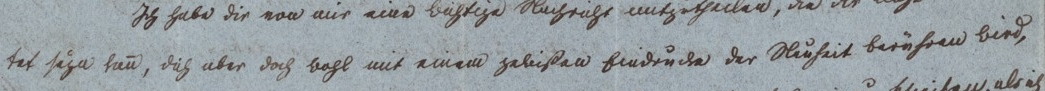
tet seyn kann, Dich aber doch wohl mit einem gewissen Eindrucke der Neuheit berühren wird,
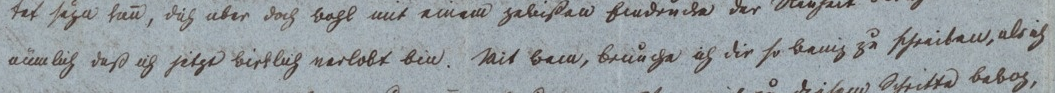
nämlich daß ich jetzt wirklich verlobt bin. Mit wem, brauche ich Dir so wenig zu schreiben, als ich
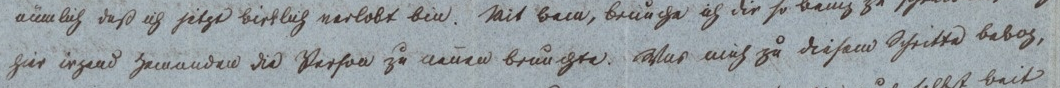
hier irgend Jemanden die Person zu nennen brauchte. Was mich zu diesem Schritte bewog,
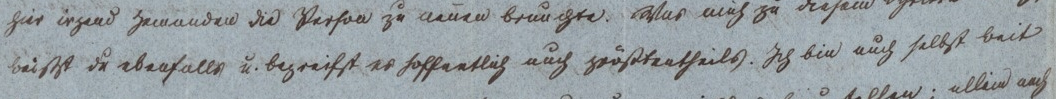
weißst Du ebenfalls u. begreifst es hoffentlich auch größtentheils. Ich bin auch selbst weit
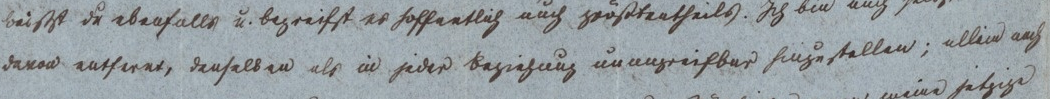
davon entfernt, denselben als in jeder Beziehung unangreifbar hinzustellen; allein nach
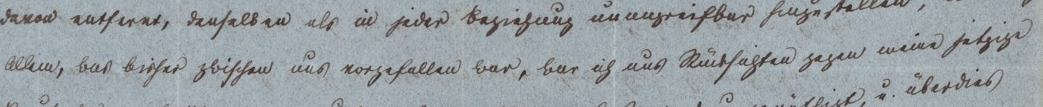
Allem, was bisher zwischen uns vorgefallen war, war ich aus Rücksichten gegen meine jetzige
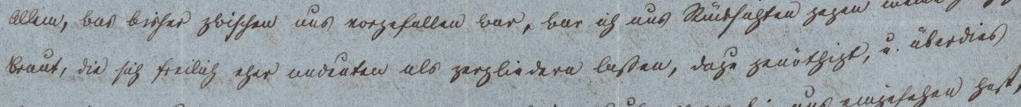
Braut, die sich freilich eher andeuten als zergliedern lassen, dazu genöthigt, u. überdies
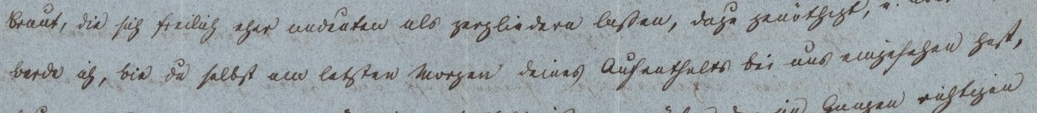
werde ich, wie Du selbst am letzten Morgen Deines Aufenthalts bei uns eingesehen hast,
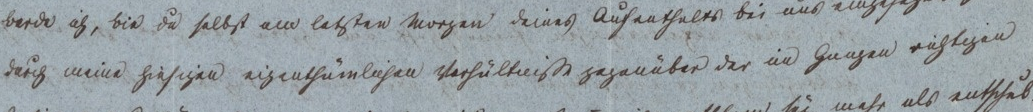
durch meine hiesigen eigenthümlichen Verhältnisse gegenüber der im Ganzen richtigen
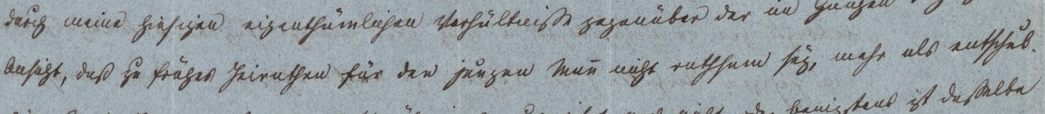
Ansicht, daß zu frühes Heirathen für den jungen Mann nicht rathsam sey, mehr als entschul-
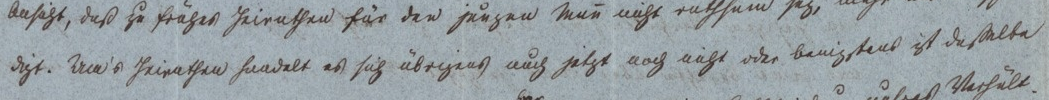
digt. Um's Heirathen handelt es sich übrigens auch jetzt noch nicht oder wenigstens ist dasselbe
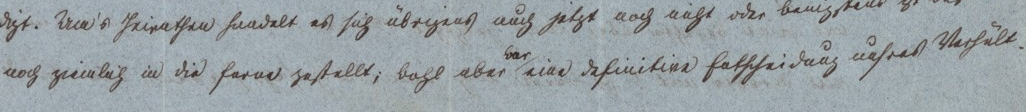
noch ziemlich in die Ferne gestellt, wohl aber war eine definitive Entscheidung unsres Verhält-
